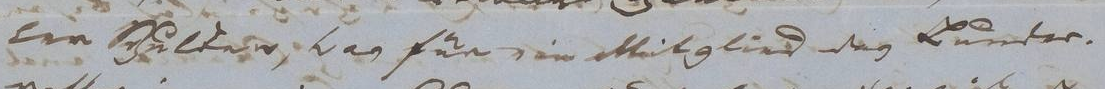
ler Schulden, was für ein Mitglied des Bundes-
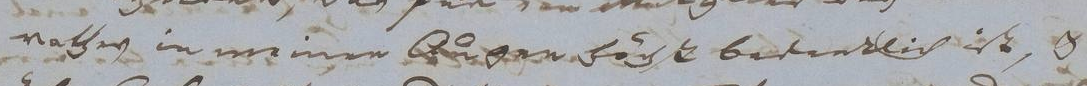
rathes in meinen Augen höchst bedenklich ist, &
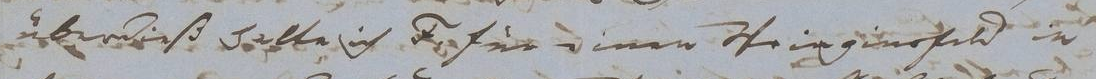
überdieß halte ich F. für einen Springinsfeld in
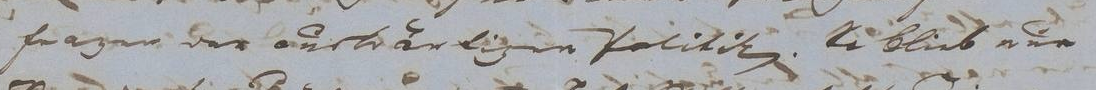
Fragen der auswärtigen Politik. So blieb nur
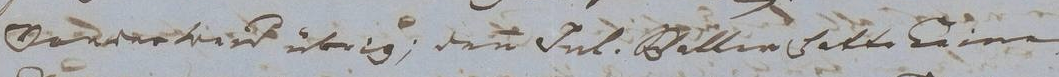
Vonderweid übrig; denn Jul. Schaller hatte keine
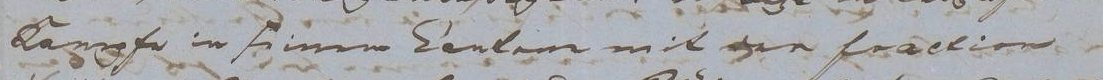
Kampfe in seinem Canton mit der Fraction
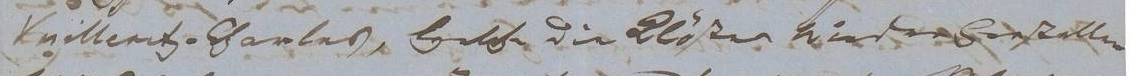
Vuilleret-Charles, welche die Klöster wieder herstellen
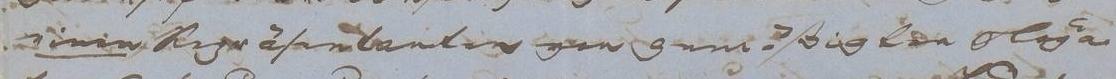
einen Repräsentanten von gemäßigter & loya-
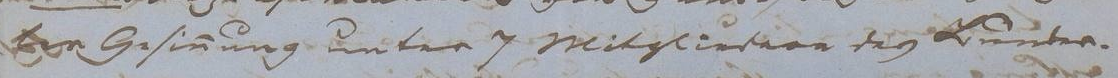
ler Gesinnung unter 7 Mitgliedern des Bundes-
